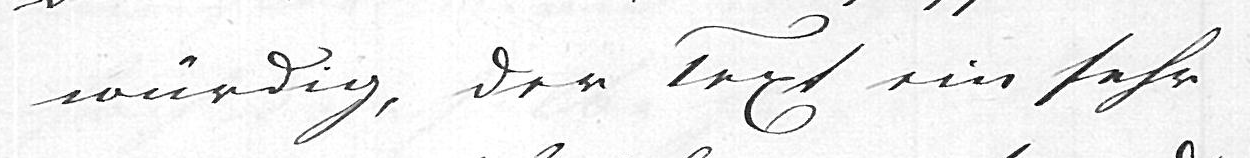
würdig, der Text ein sehr
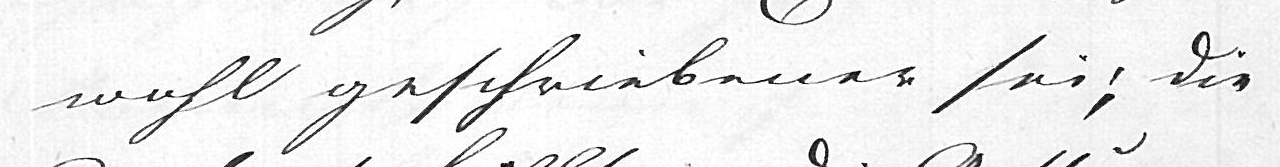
wohl geschriebener sei; die
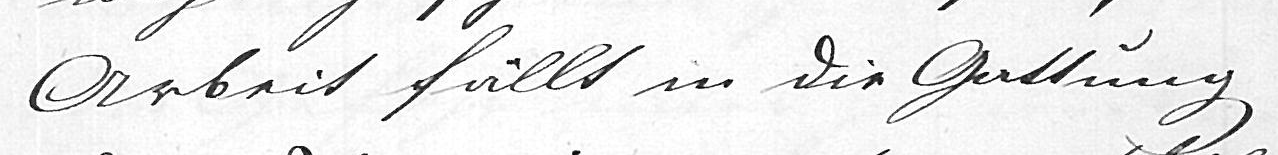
Arbeit fällt in die Gattung
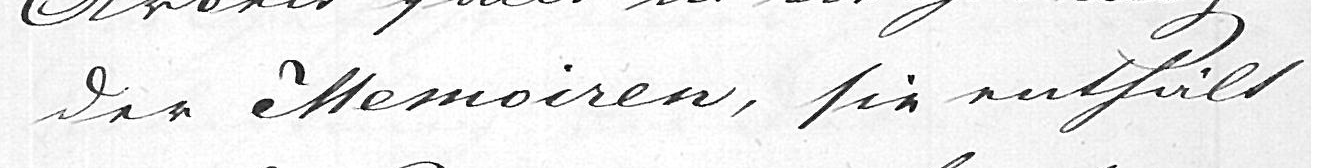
der Memoiren, sie enthält
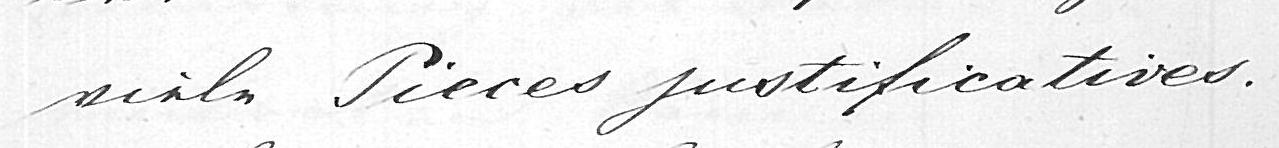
viele Pieces justificatives.
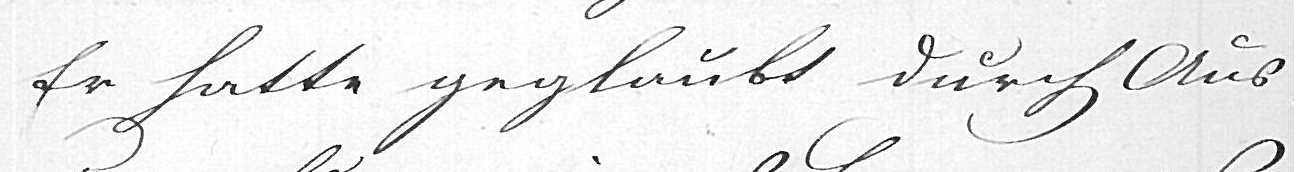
Er hatte geglaubt durch Aus-
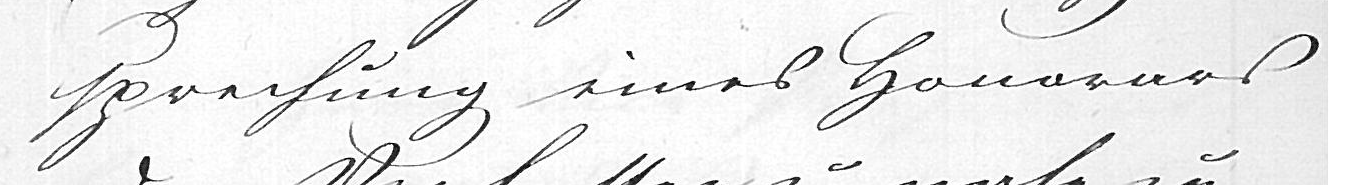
sprechung eines Honorars
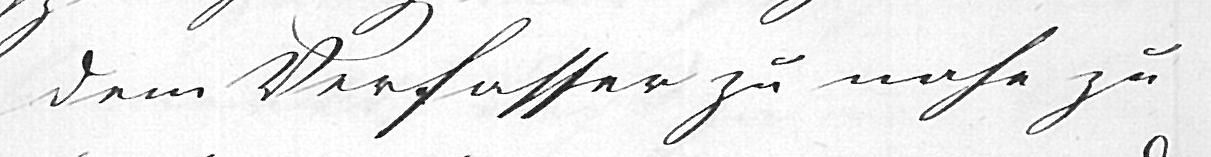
dem Verfasser zu nahe zu
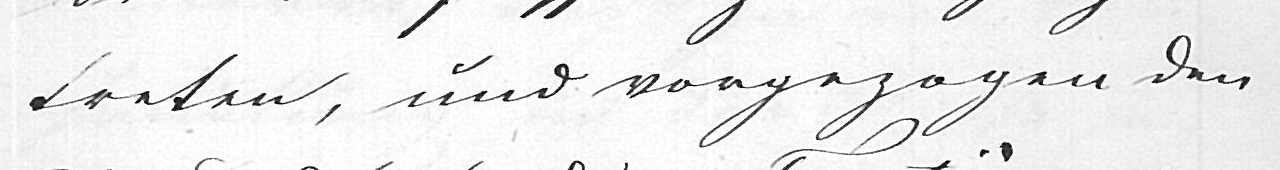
treten, und vorgezogen den
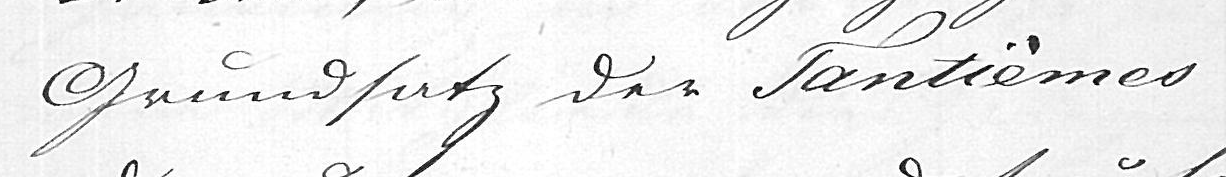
Grundsatz der Tantièmes
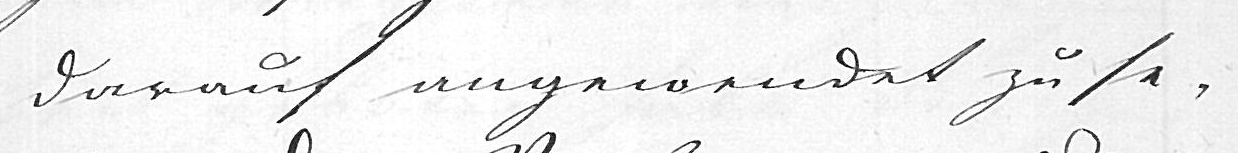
darauf angewendet zu se-
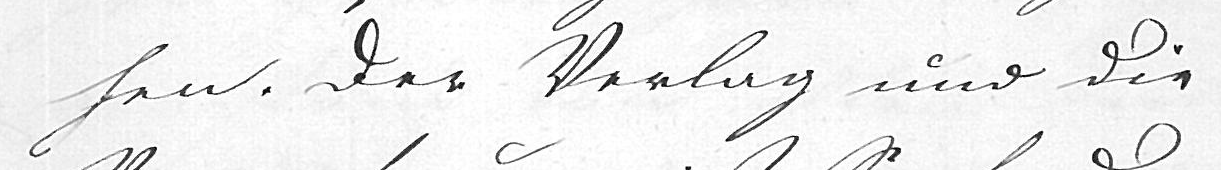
hen. Der Verlag und die
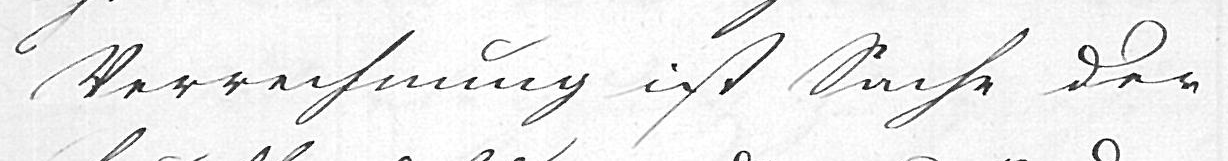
Verrechnung ist Sache der
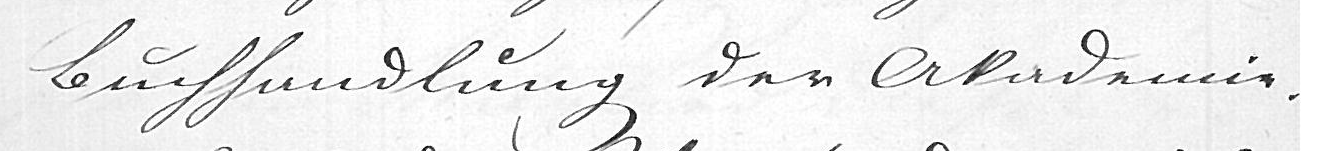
Buchhandlung der Akademie.
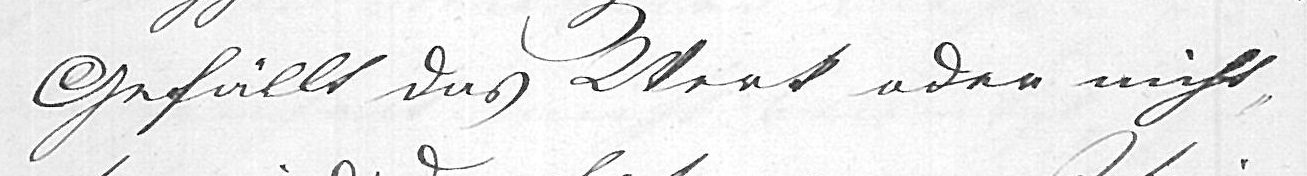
Gefällt das Werk oder nicht,
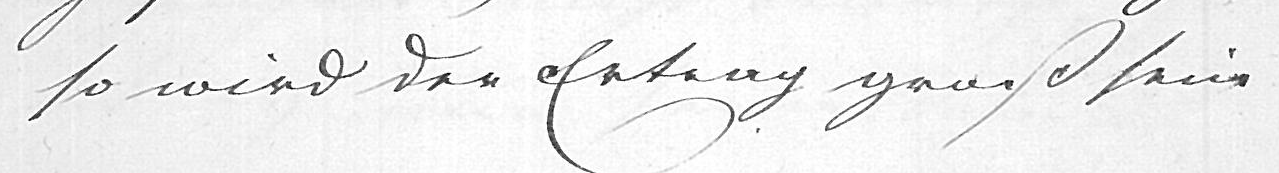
so wird der Ertrag groß sein
